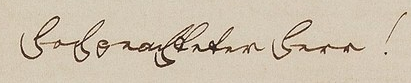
Hochgeachteter Herr!
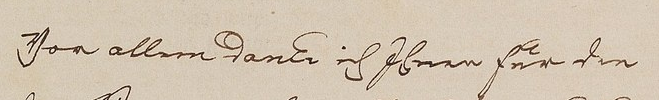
Vor allem danke ich Ihnen für den
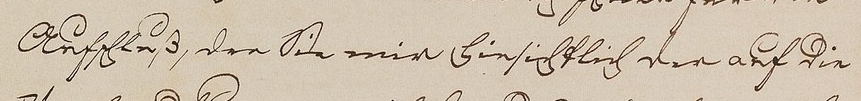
Aufschluß, den Sie mir hinsichtlich der auf die
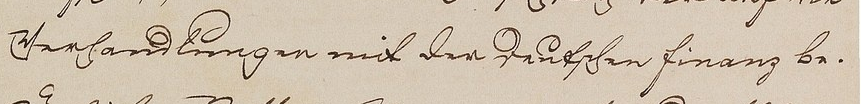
Verhandlungen mit der deutschen Finanz be-
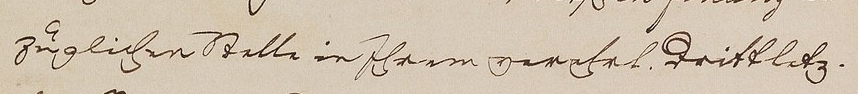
züglichen Stelle in Ihrem verehrl. Drittletz-
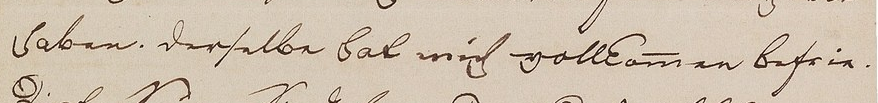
haben. Derselbe hat mich vollkommen befrie-
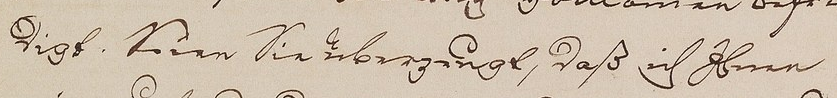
digt. Seien Sie überzeugt, daß ich Ihnen
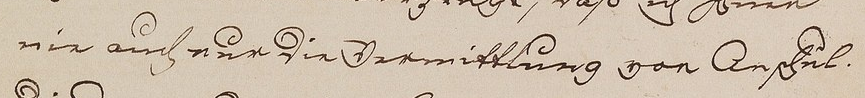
nie auch nur die Vermittlung von Anschul-
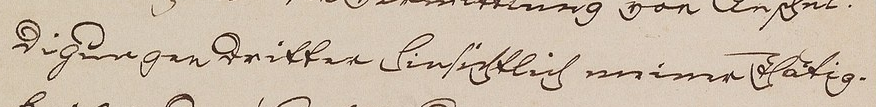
digungen Dritter hinsichtlich meiner Thätig-
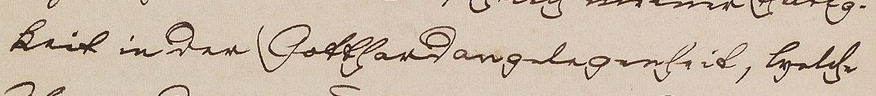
keit in der Gotthardangelegenheit, welche
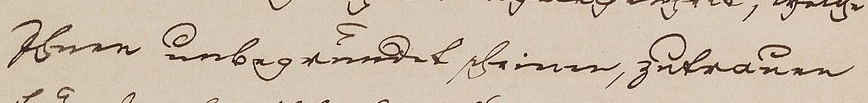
Ihnen unbegründet scheinen, zutrauen
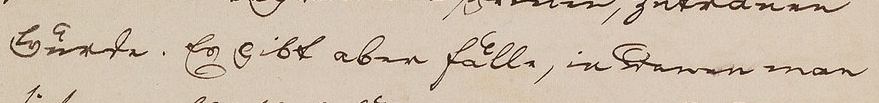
würde. Es gibt aber Fälle, in denen man
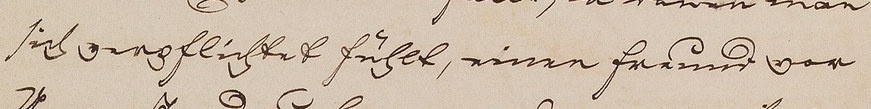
sich verpflichtet fühlt, einen Freund vor
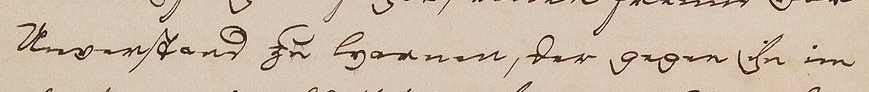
Unverstand zu warnen, der gegen ihn im
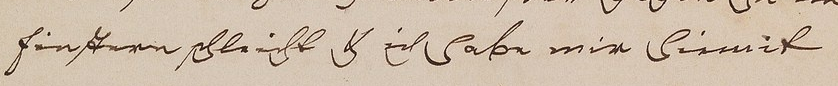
Finstern schleicht & ich habe mir hiemit
